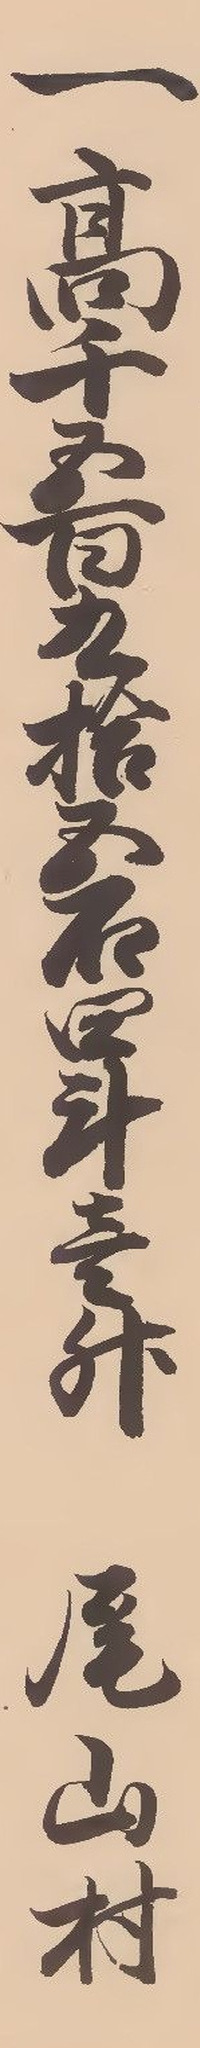一高千五百九拾五石四斗壱升尾山村
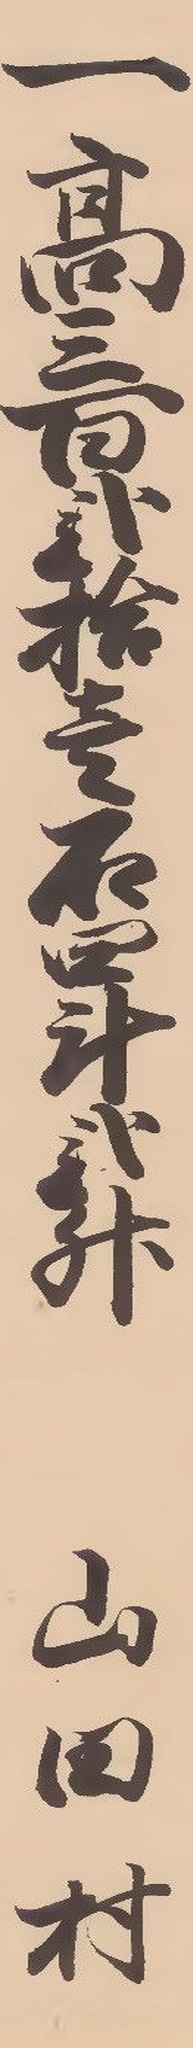一高三百弐拾壱石四斗弐升山田村
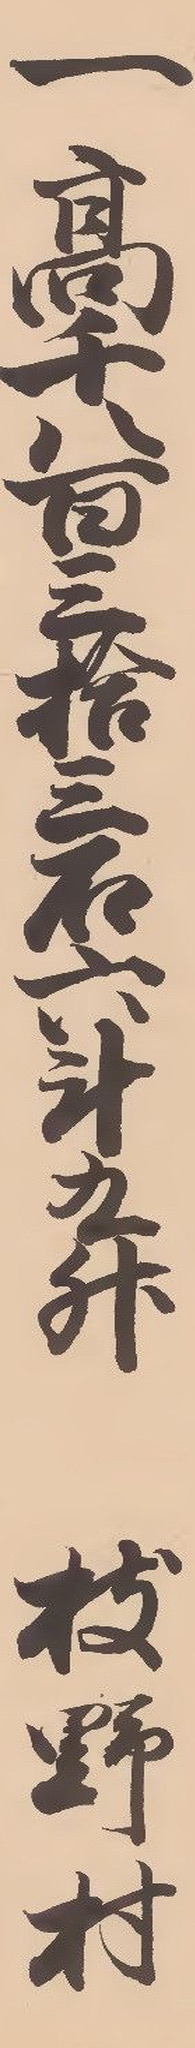一高千八百三拾三石六斗九升枝野村
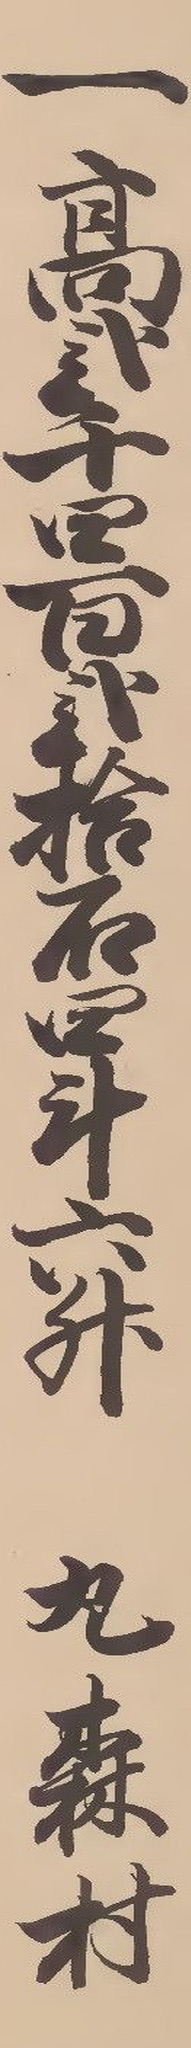一高弐千四百弐拾石四斗六升丸森村
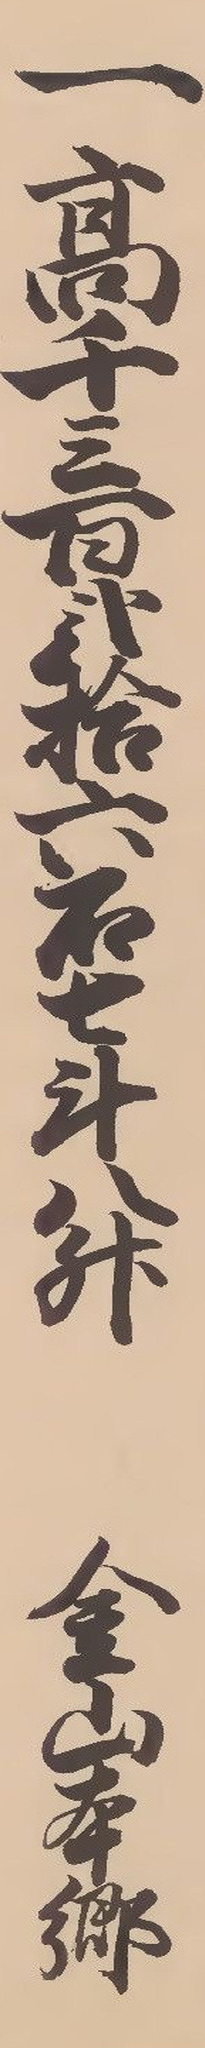一高千三百弐拾六石七斗八升金山本郷
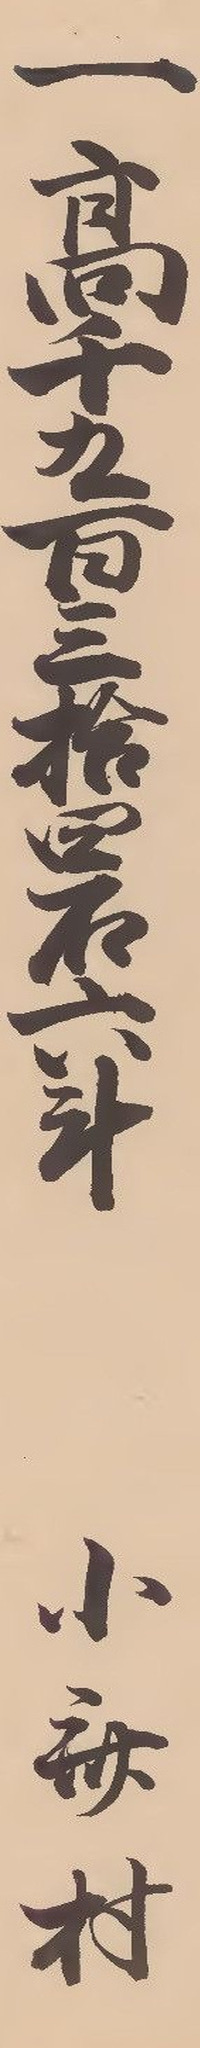一高千九百三拾四石六斗小斎村
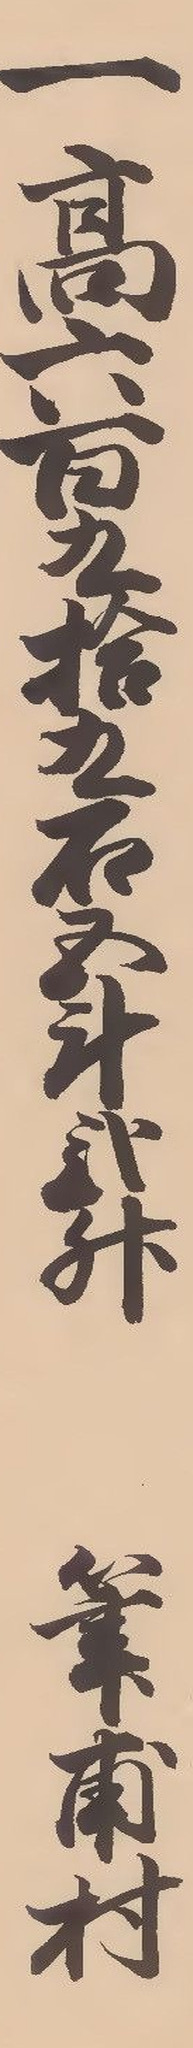一高六百九拾九石五斗弐升筆甫村

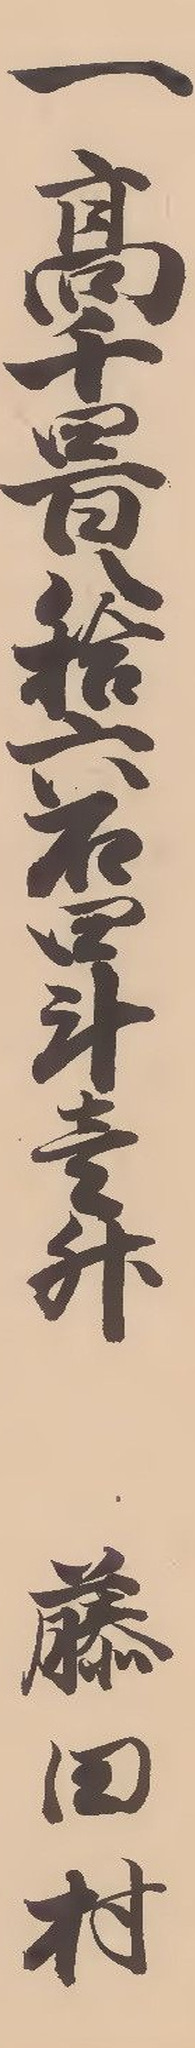一高千四百八拾六石四斗壱升藤田村
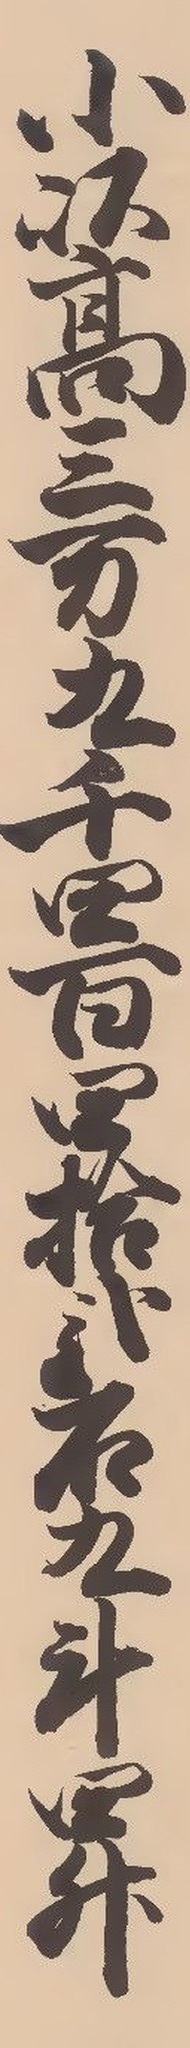小以高三万九千四百四拾弐石九斗四升
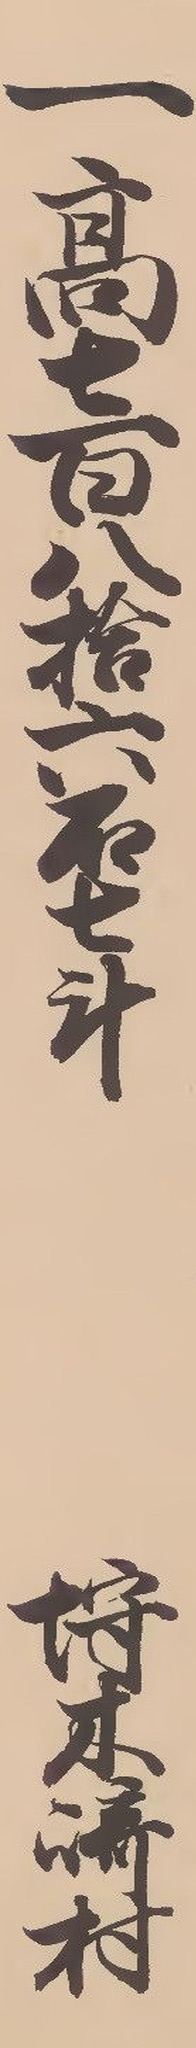一高七百八拾六石七斗埒木崎村
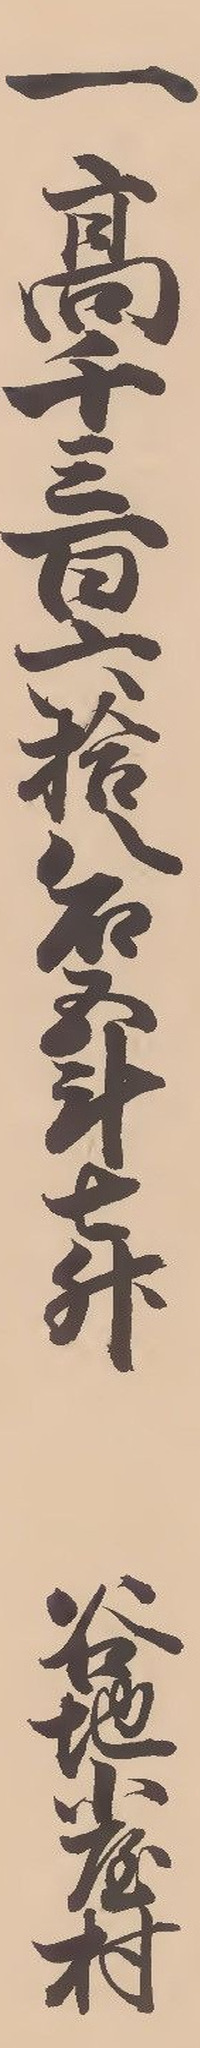一高千三百六拾八石五斗七升谷地小屋村
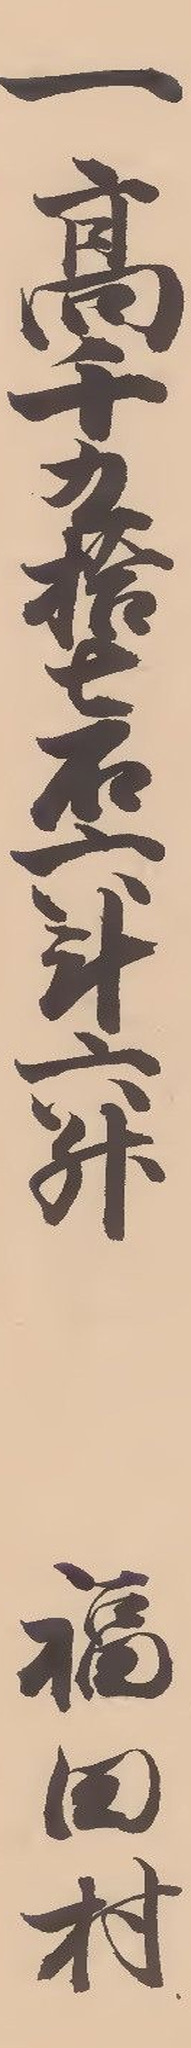一高千九拾七石六斗六升福田村

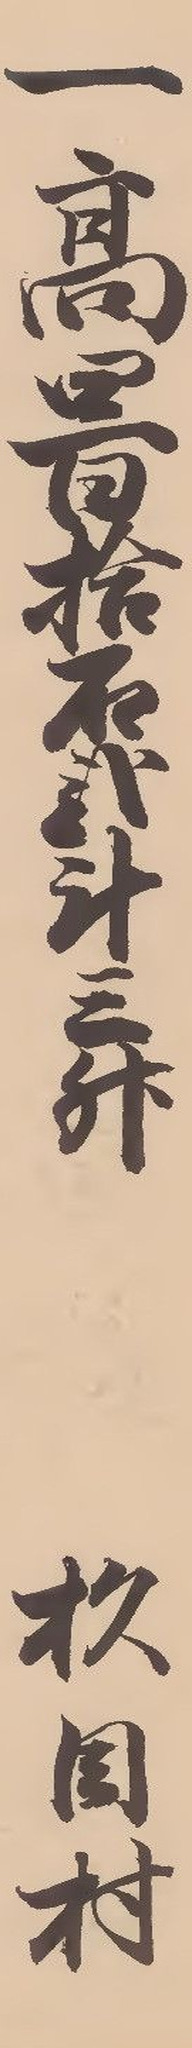一高四百拾石弐斗三升杉目村
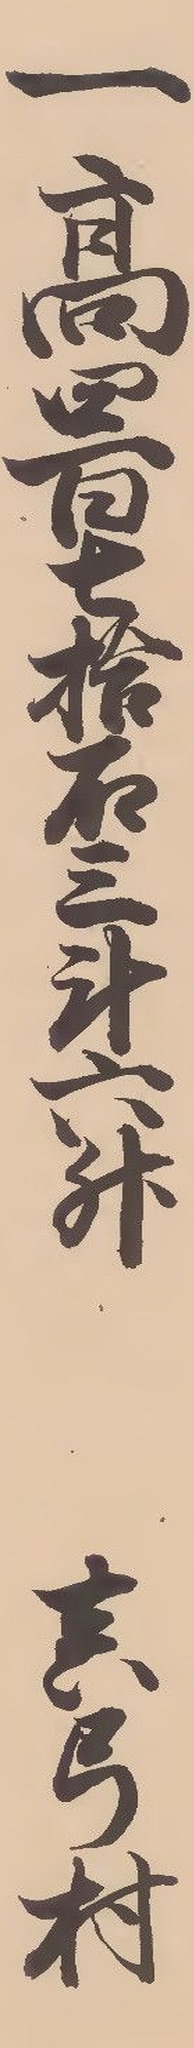一高四百七拾石三斗六升真弓村
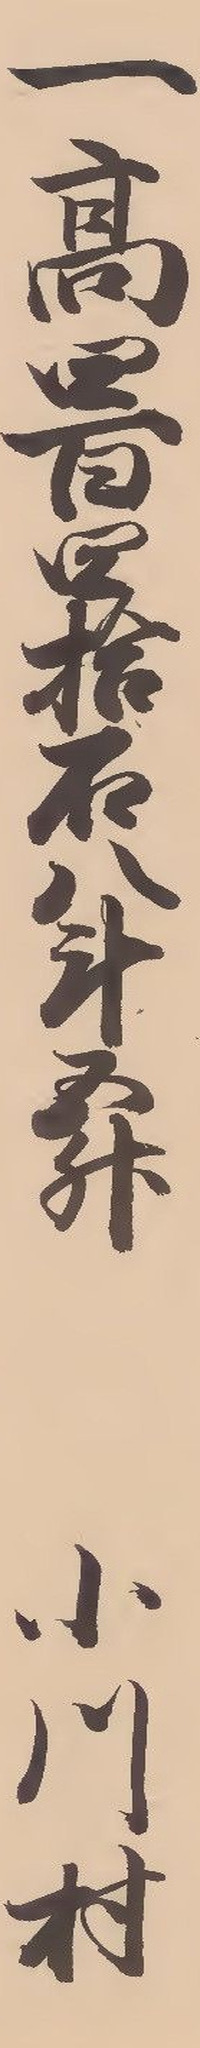一高四百四拾石八斗五升小川村
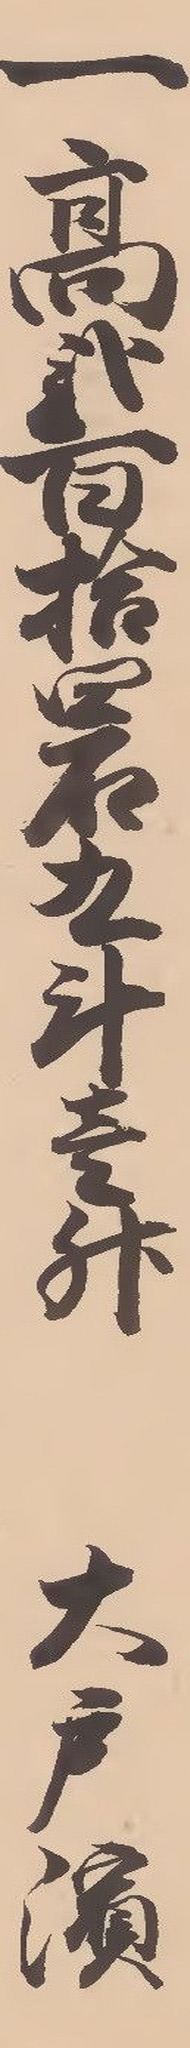一高弐百拾四石九斗壱升大戸浜
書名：陸奥国郷帳　５
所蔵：国立公文書館 National Archives of Japan
